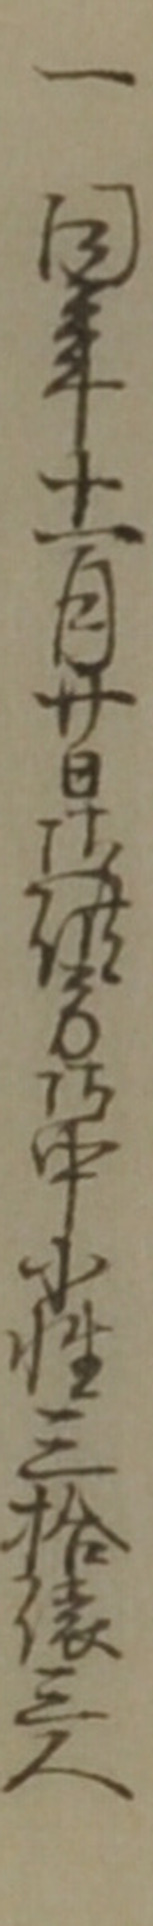一同年十一月廿日御供方御中小性三拾俵三人
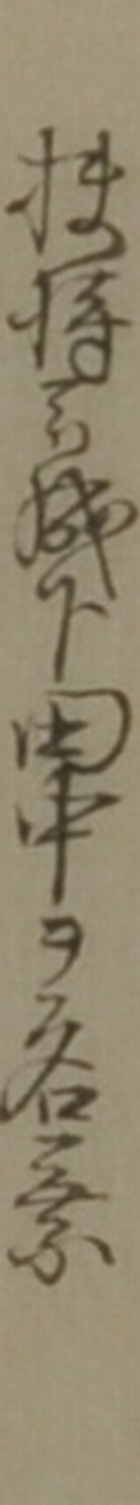扶持被成下田中ヲ名乗
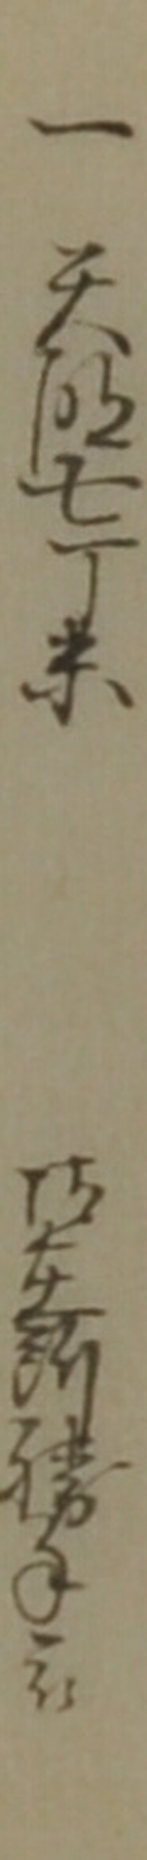一天明七丁未御在所勝手被

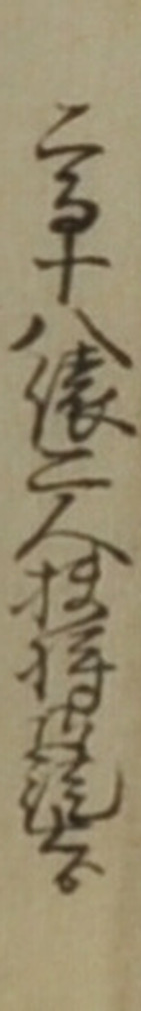高十八俵二人扶持御徒士ゟ
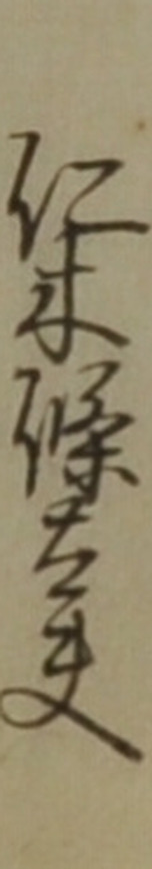仁木條大夫
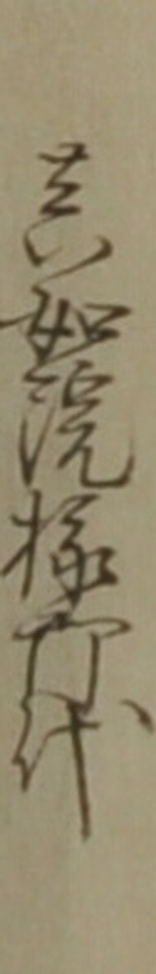真如院様御代
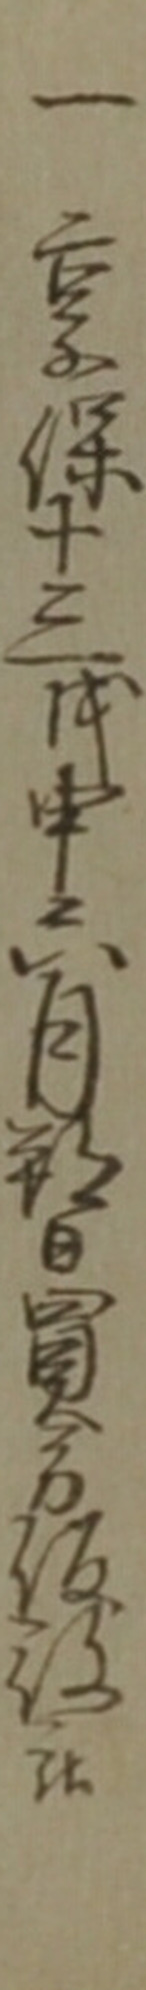一享保十三戊申六月朔日買方仮役被
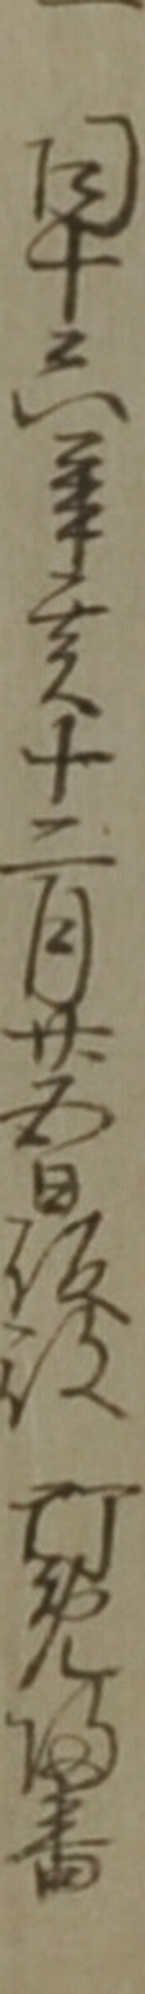一同十六辛亥十二月廿五日仮役御免帰番
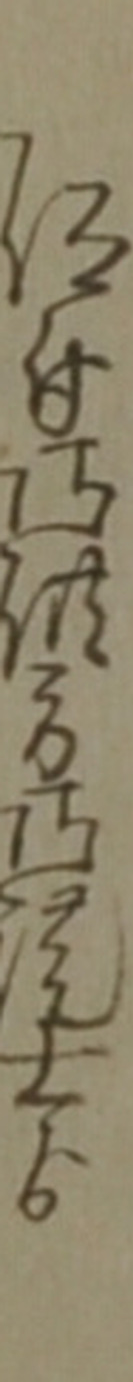仰付御供方御徒士ゟ
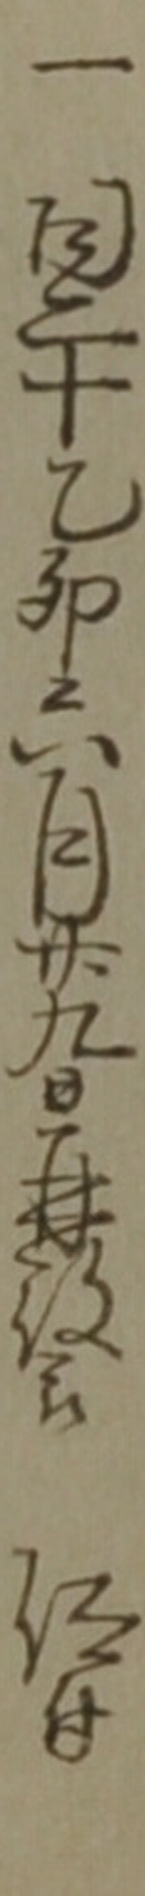一同二十乙卯六月廿九日再役被仰付
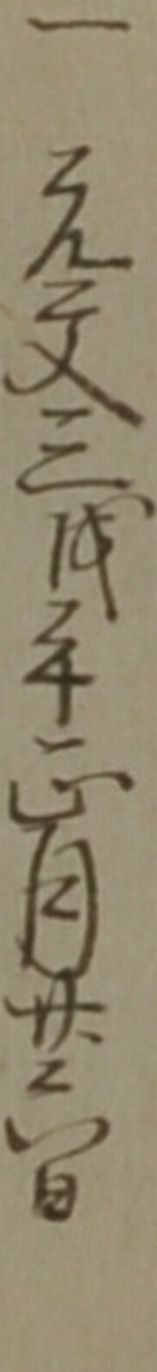一元文三戊午正月廿六日
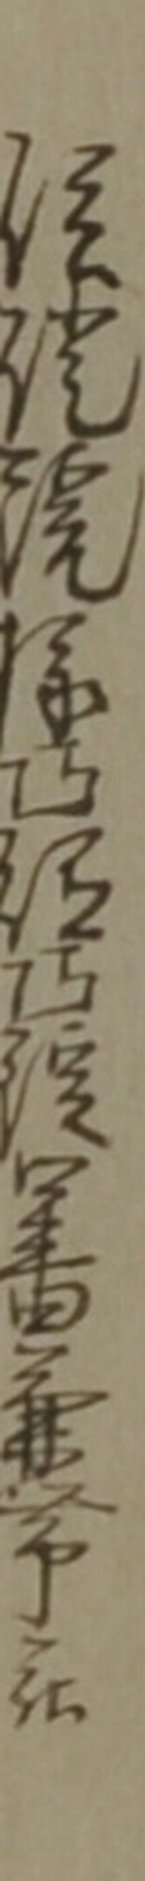信証院様御賄御錠口番兼帯被
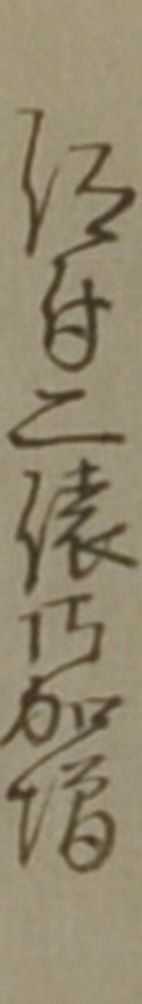仰付二俵御加増
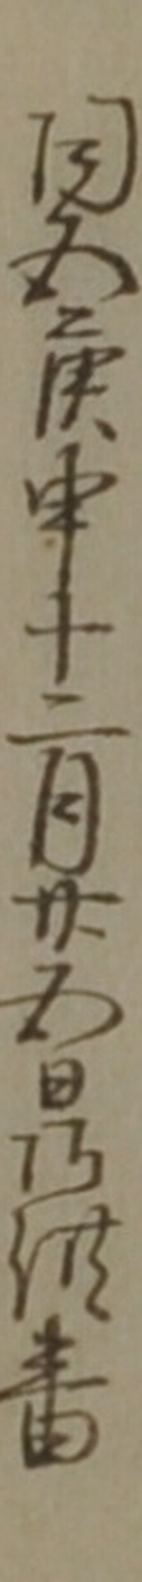一同五庚申十二月廿五日御供番
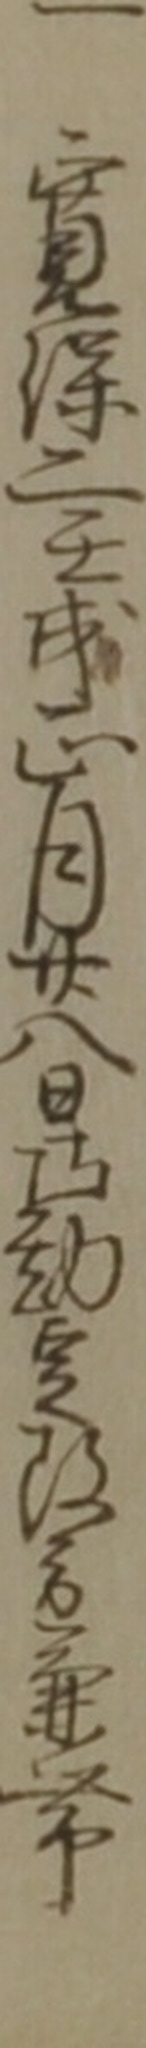一寛保二壬戌正月廿八日御勘定改方兼帯
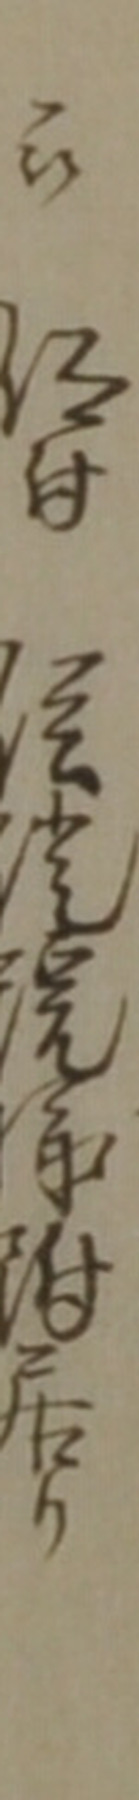被仰付信証院様附居
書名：無足廃家（壱）
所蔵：伊那市立高遠町図書館・合同会社AMANE
